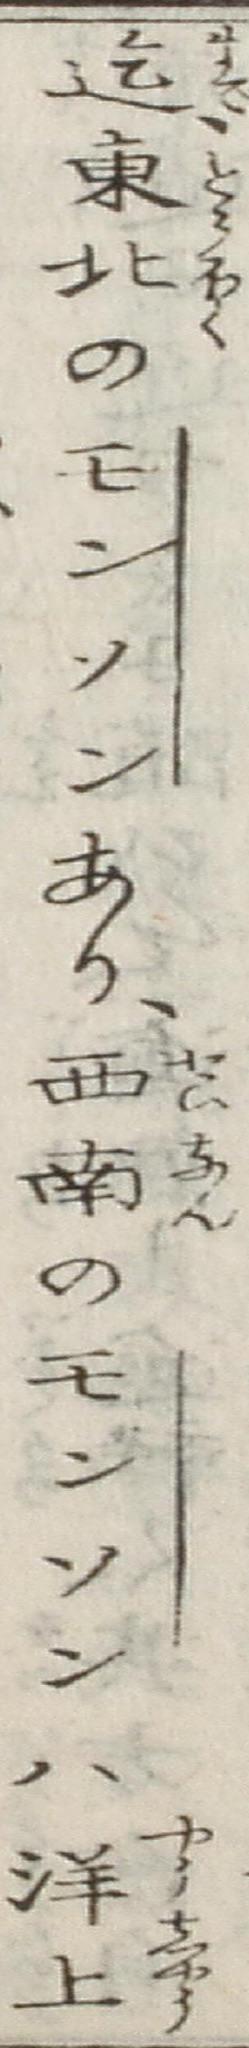迄、東北のモンソンあり、西南のモンソンは洋上
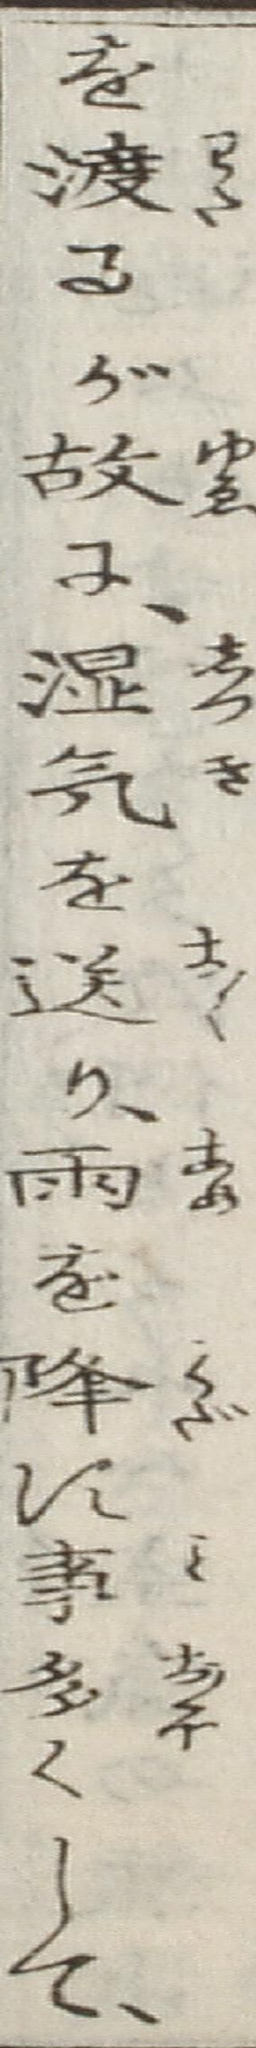を渡るが故に、湿気を送り、雨を降す事多くして、
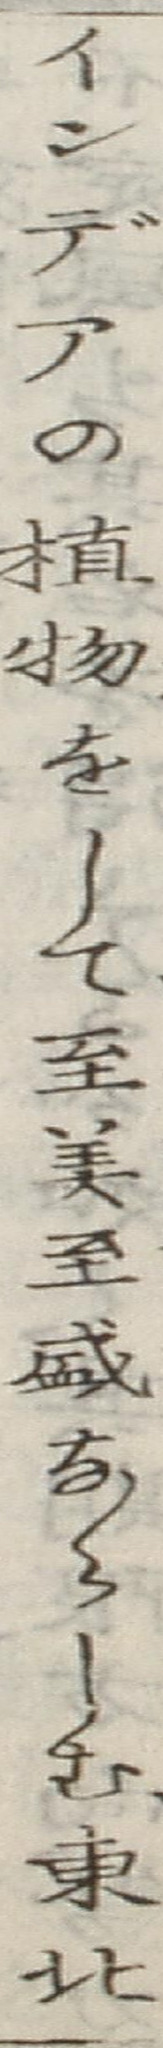インデアの植物をして、至美至盛なからしむ、東北
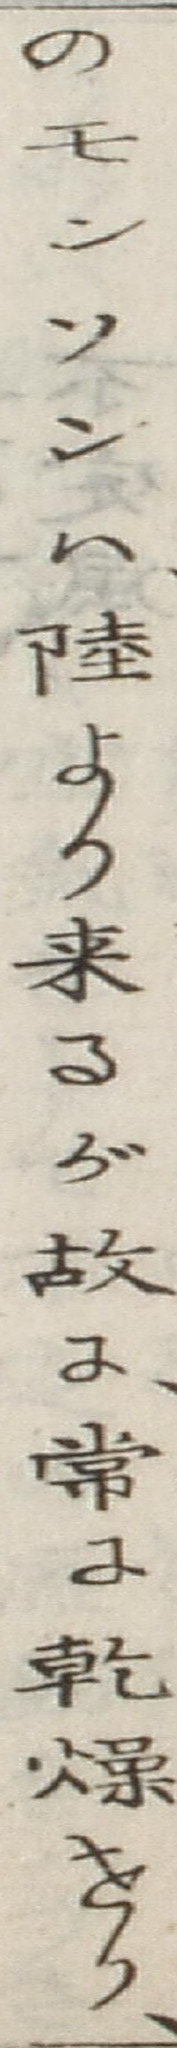のモンソンは、陸より来るが故に乾燥せり、
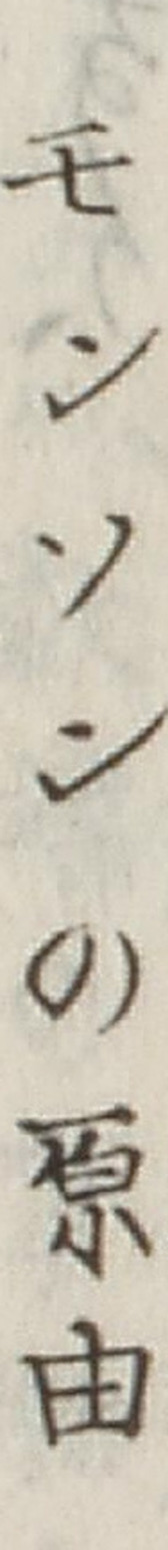モンソンの原由
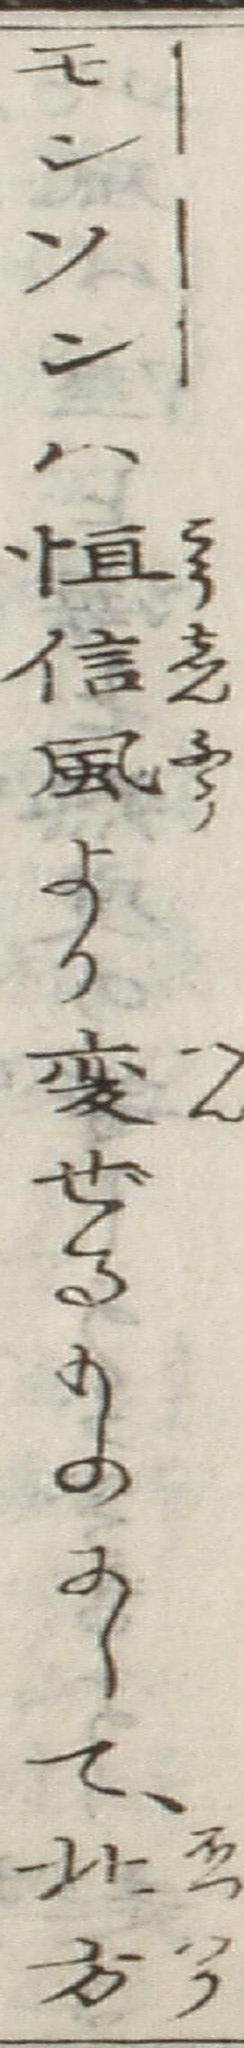モンソンは恒信風より変ぜるものにして、北方
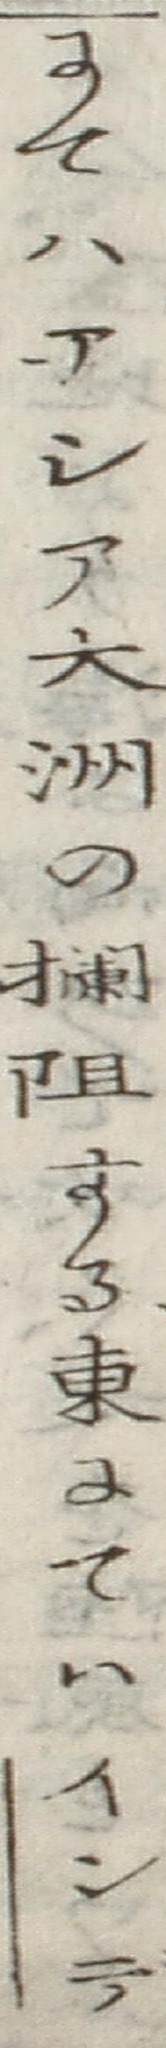にてはアシア大洲の攔阻する、東にてはインデ
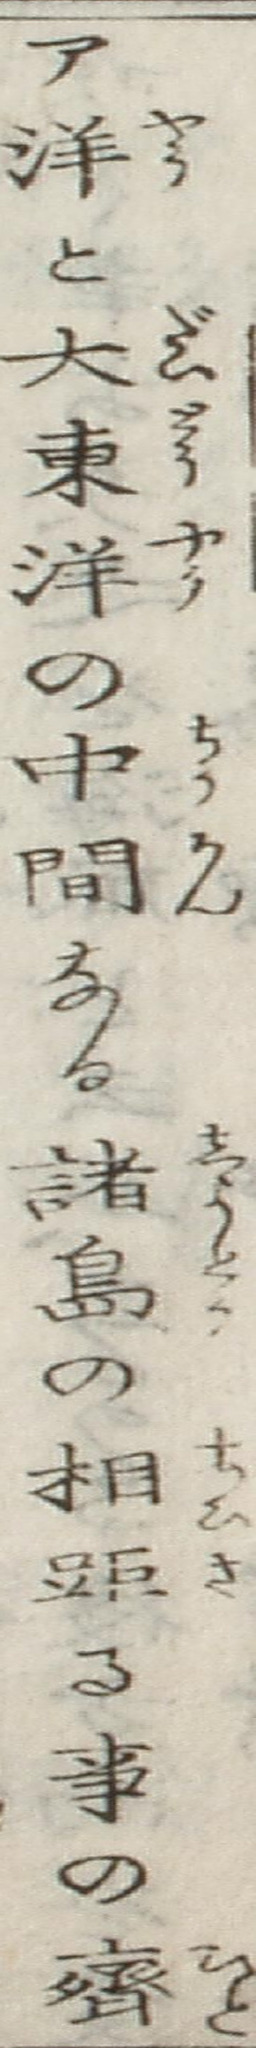ア洋と大東洋の中間なる諸島の相距る事の齋
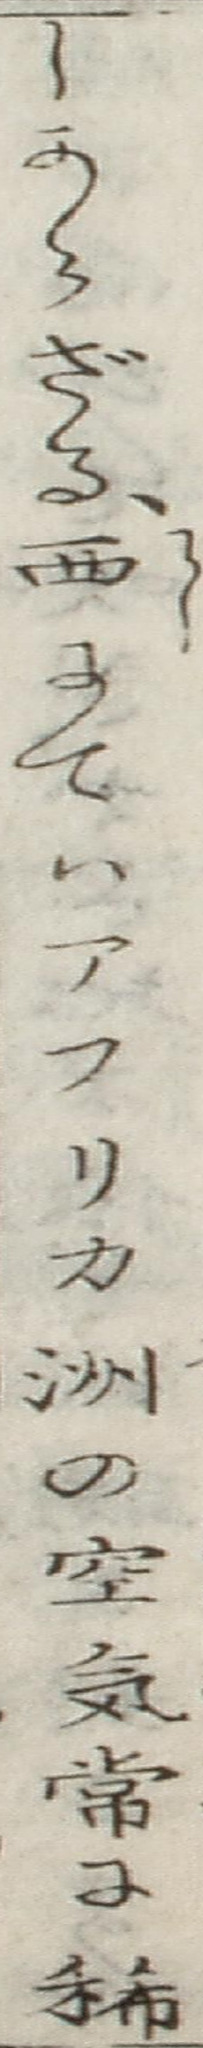しからざる、西にてはアフリカ洲の空気常に希
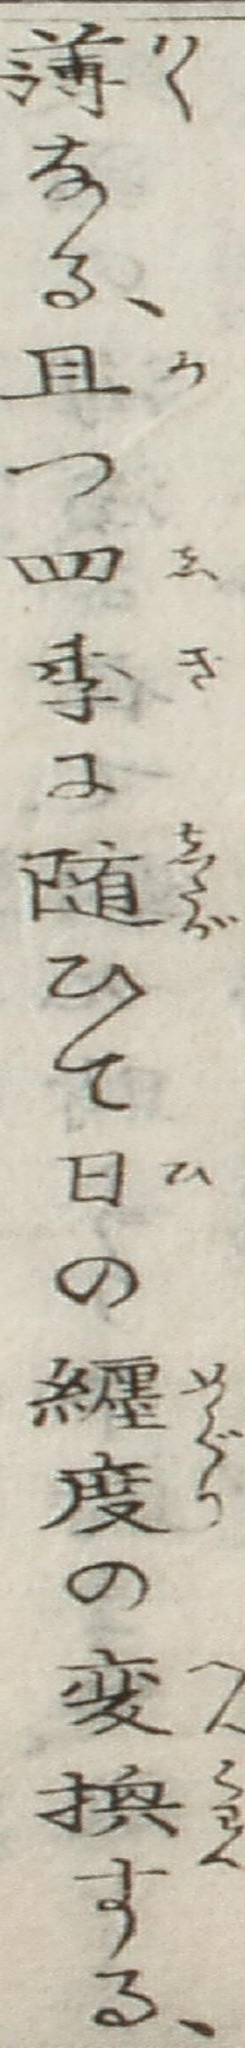薄なる、且つ四季に随ひて日の纏度の変換する、
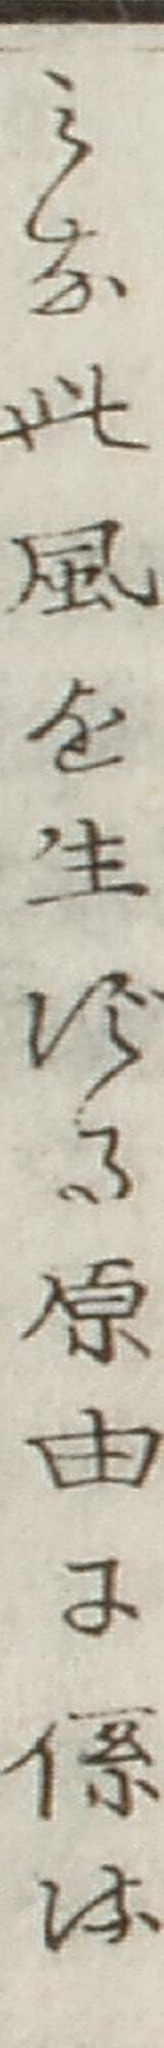みな此風を生ずる原由に係る、

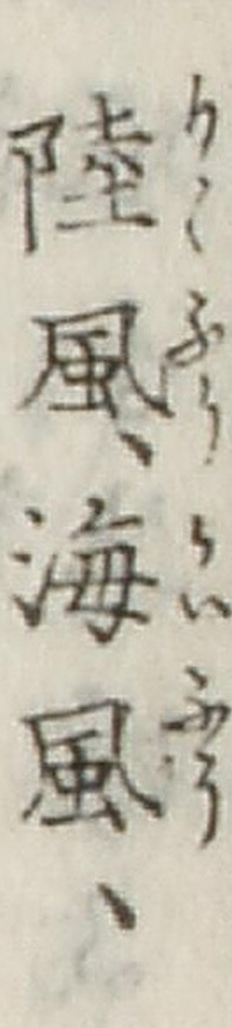陸風、海風、
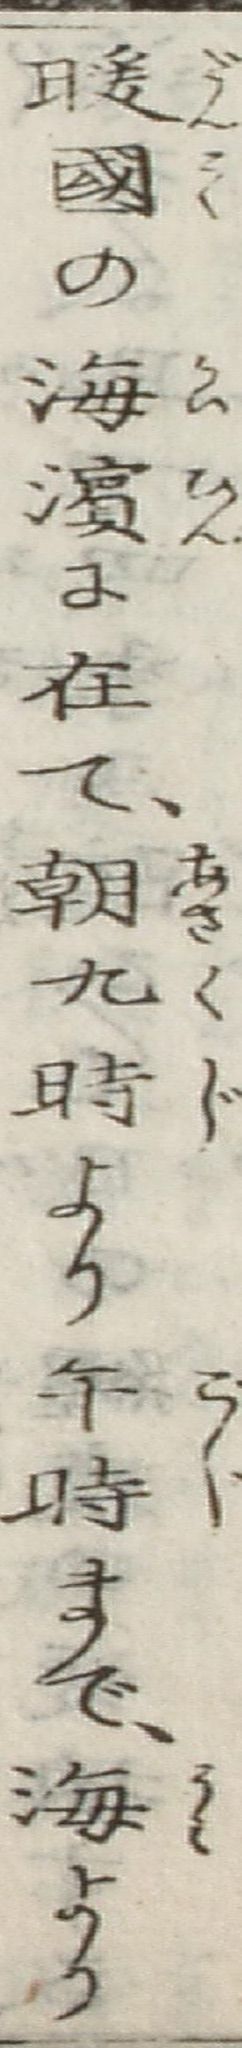暖國の海濱に在て、朝九時より午時まで、海より
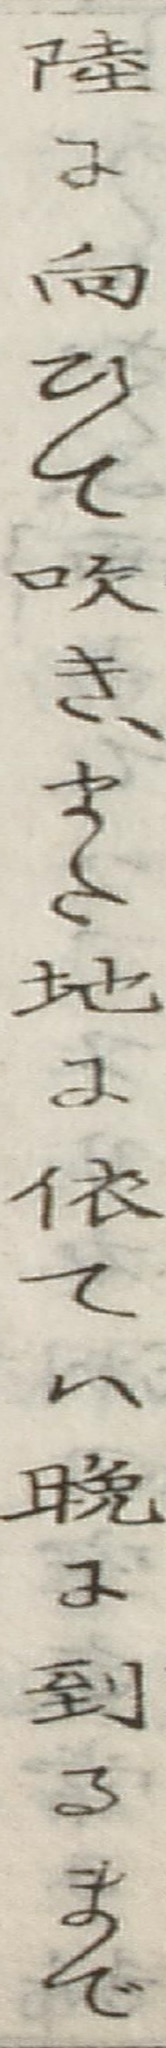陸に向ひて吹き、また地に依ては晩に到るまで
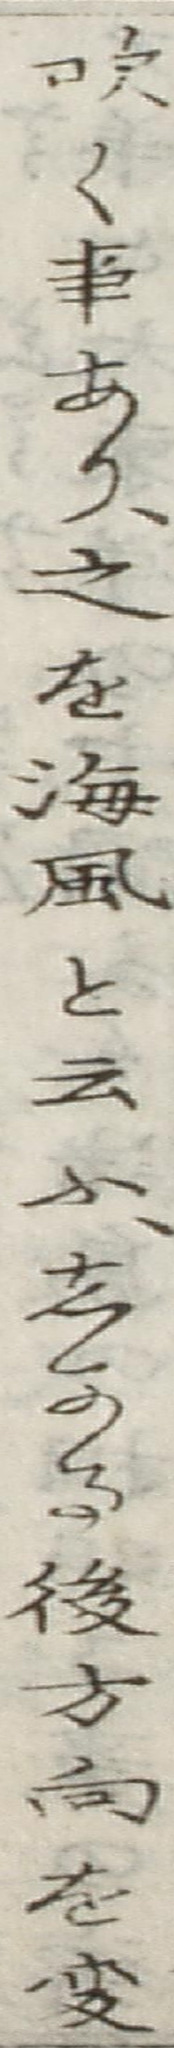吹く事あり、之を海風と云ふ、しかる後方向を変
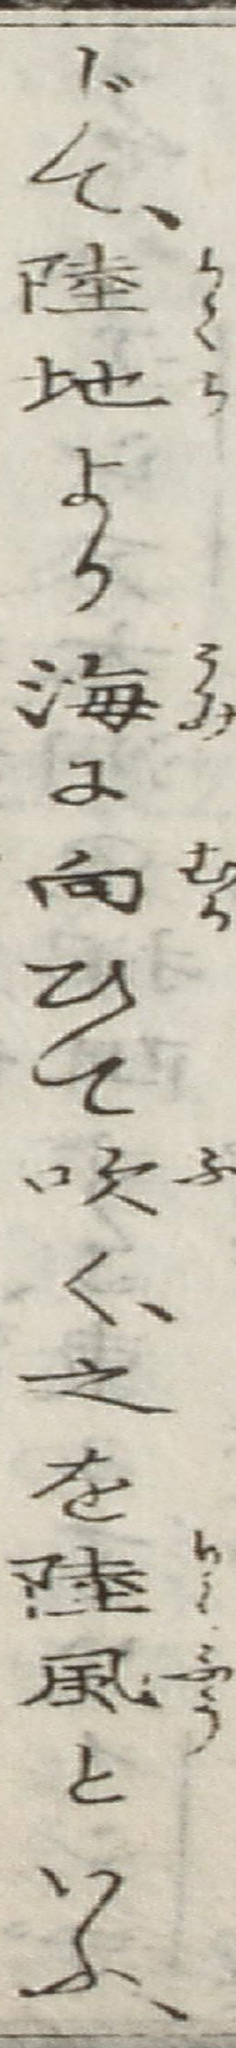じて、陸地より海に向ひて吹く、之を陸風といふ、
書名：訓蒙　天然地理學　中
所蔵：東京大学地震研究所図書室 Earthquake Research Institute Library, The University of Tokyo, JAPAN
